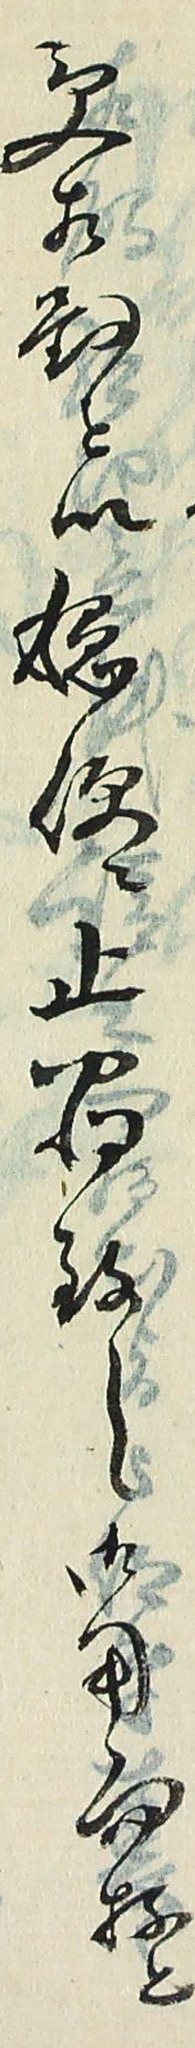受相勤を以穏便に止宿致し御用向抔と
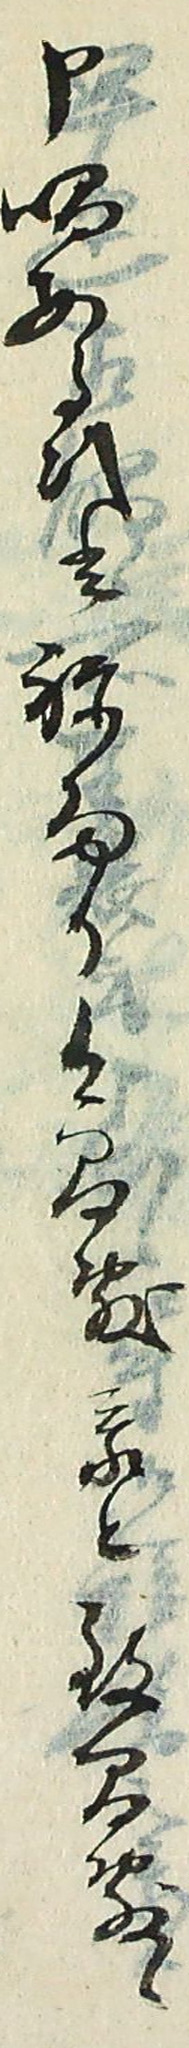申唱あるひはねたりケ間敷義に致間敷候
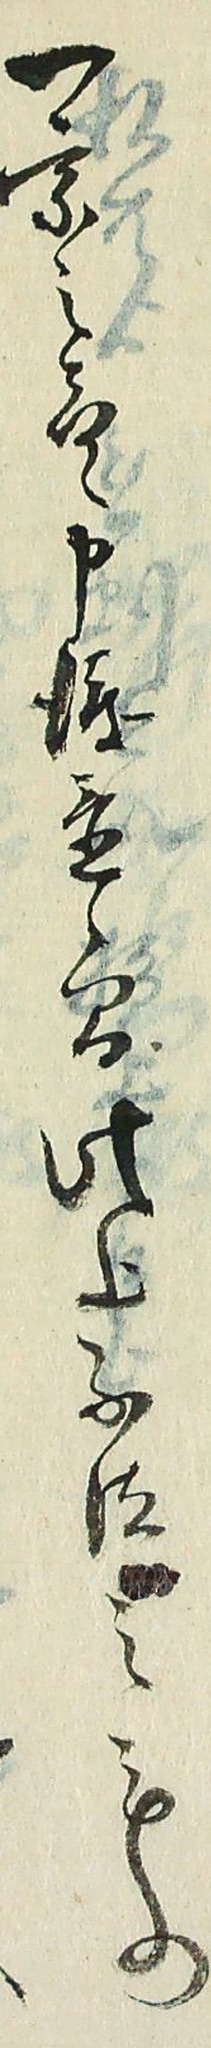一宗之者へ申渡置候間此上不法のもの
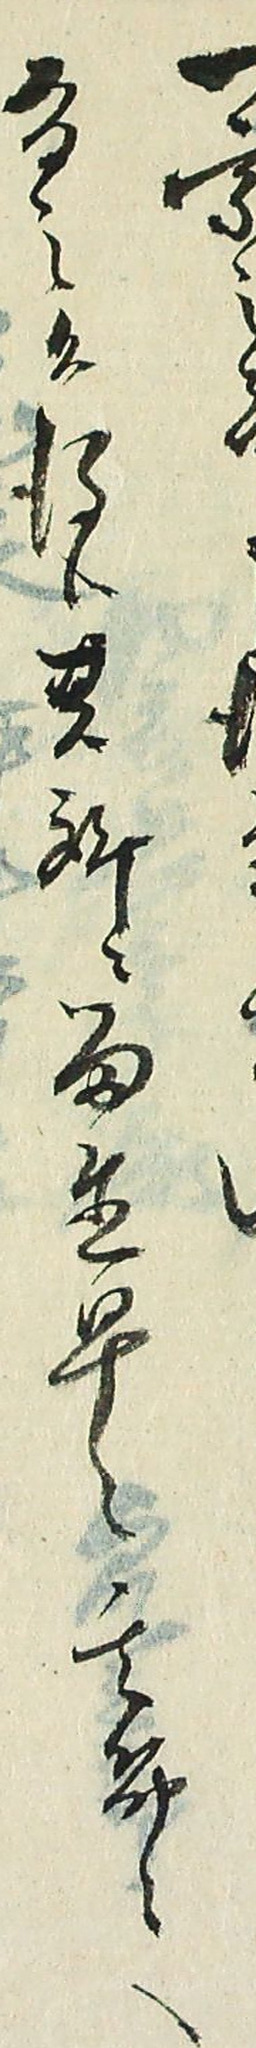有之候得は其所に留置き早々其筋々へ
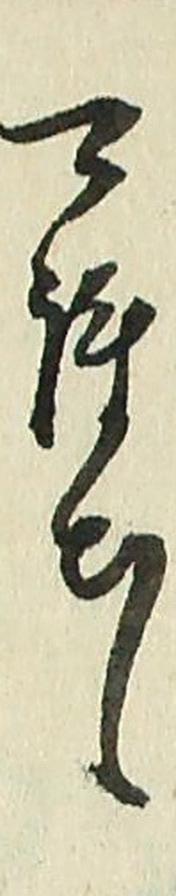可訴出候
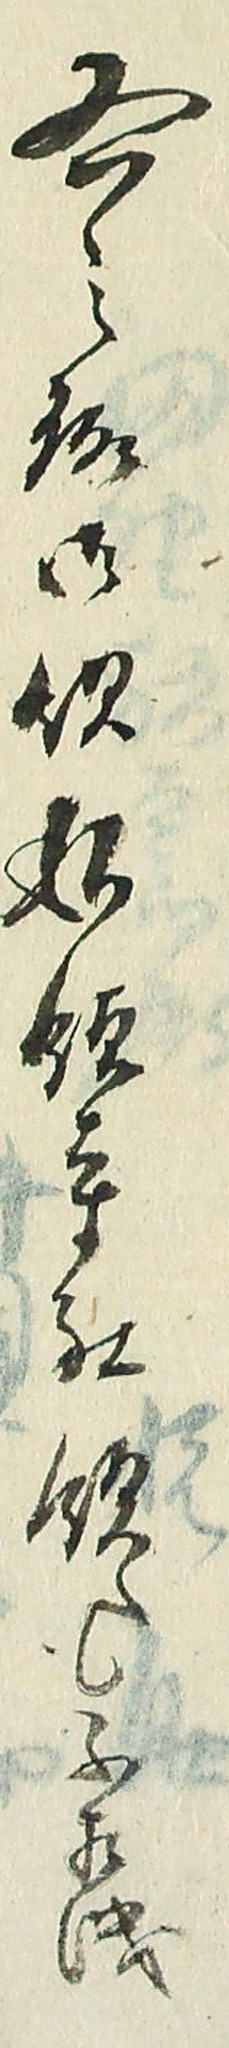右之趣御領私領寺社領へも不相洩
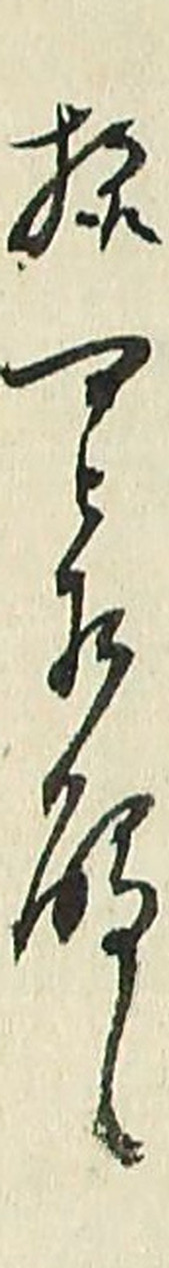様可被相触候
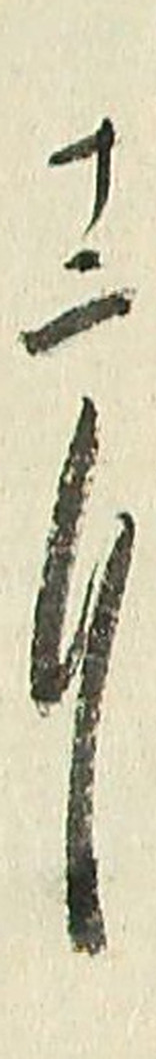十二月

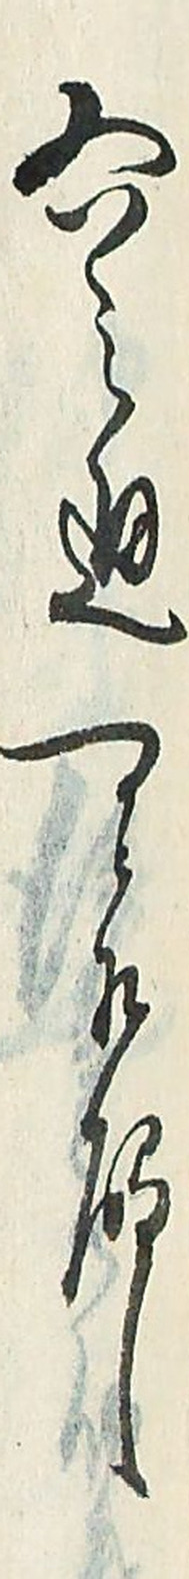右之通可被相触候
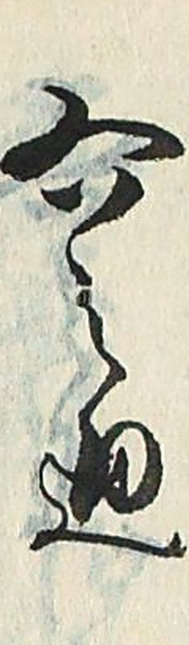右之通
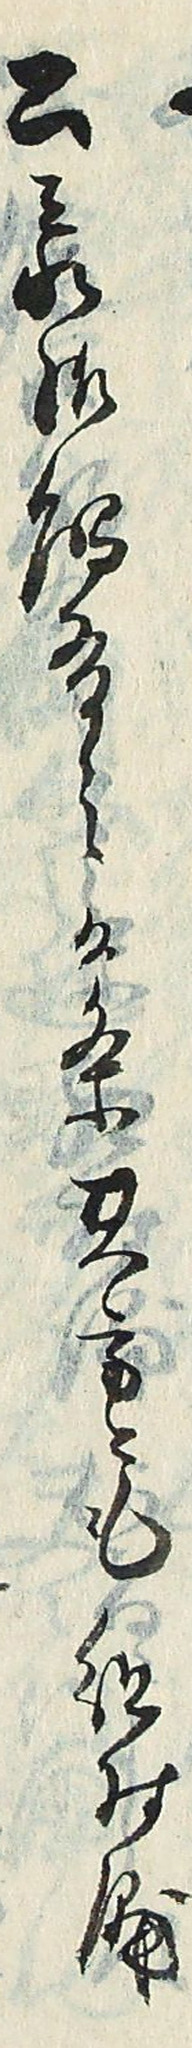公義御触有之候条其方とも組村浦
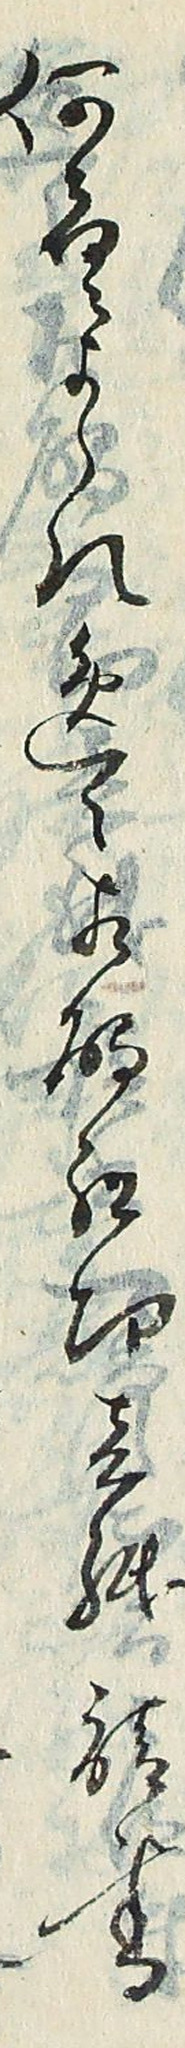何者によらす逸々相触組切壱紙請書
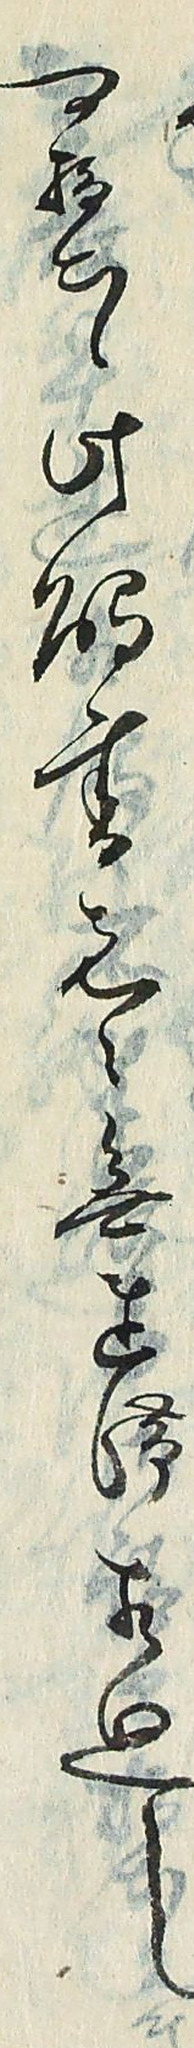可指出候此触書先々無遅滞相廻し
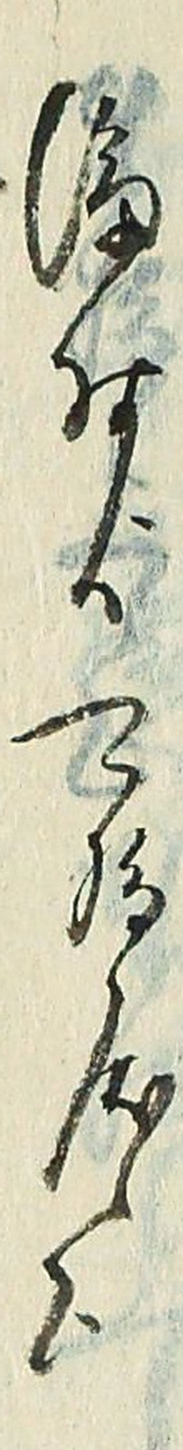済村ゟ可指戻候以上
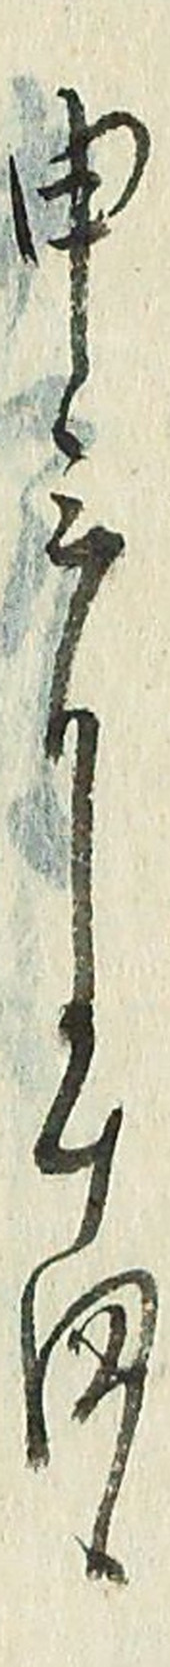申三月十四日
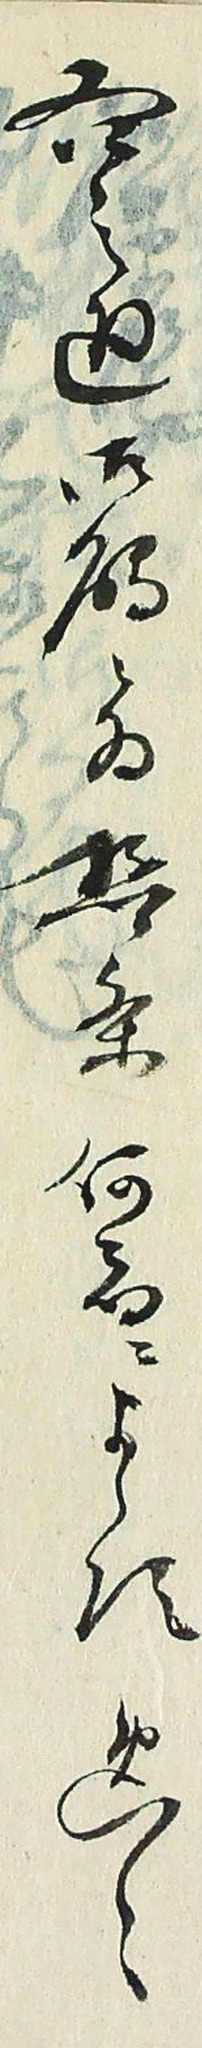右之通御触被為遊候条何者によらす逸々
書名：諸御用御□受書控
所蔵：鳴門教育大学 Naruto University of Education
